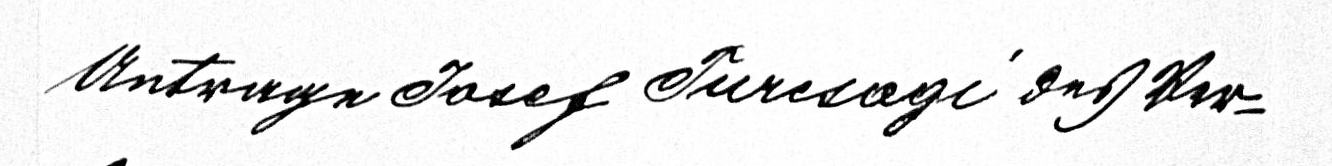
Antrage Josef Turcsagi des Ver¬
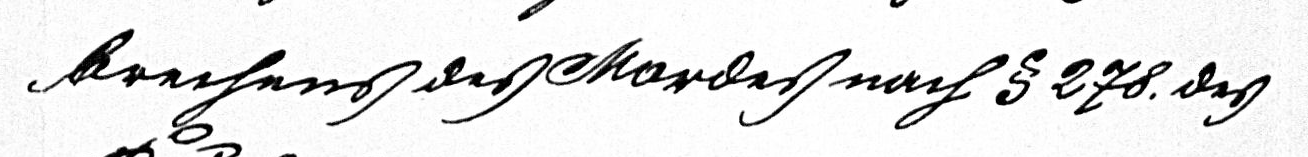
brechens des Mordes nach § 278. des
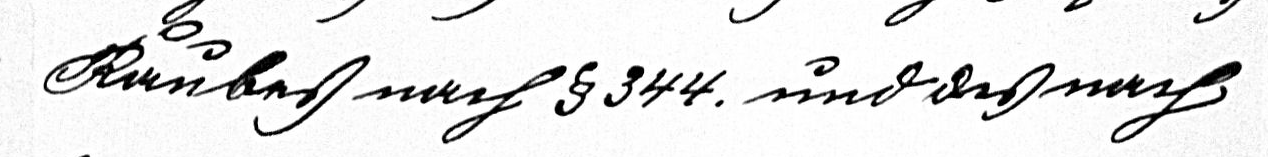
Raubes nach § 344. und des nach
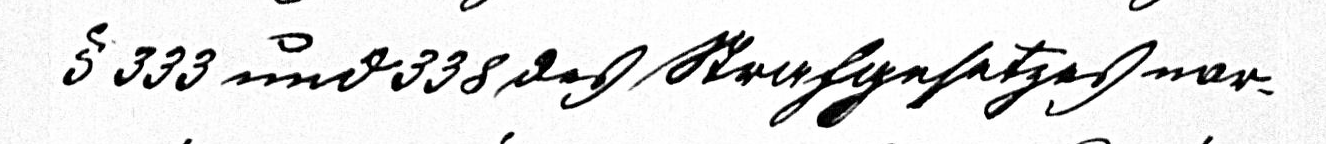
§ 333 und 338 des Strafgesetzes nor¬
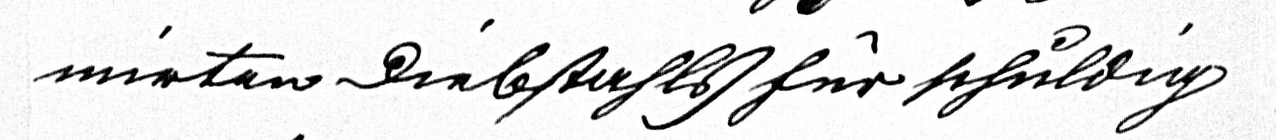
mirten Diebstahls für schuldig
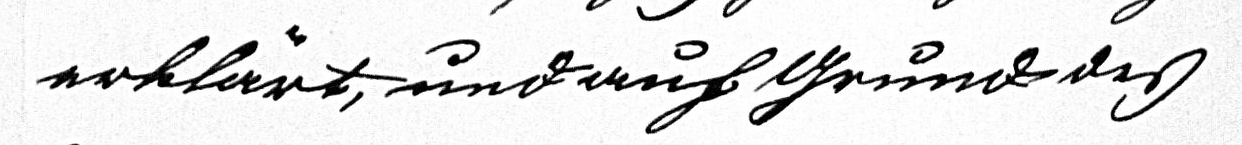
erklärt, und auf Grund des
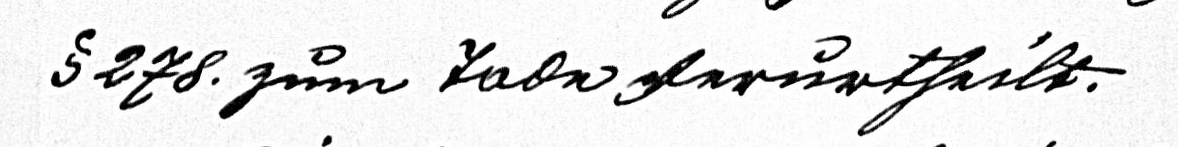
§ 278. zum Tode verurtheilt.
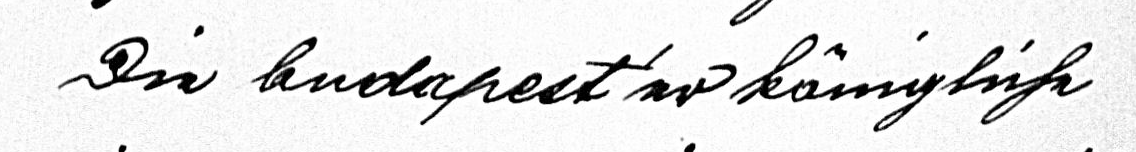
Die budapest'er königliche
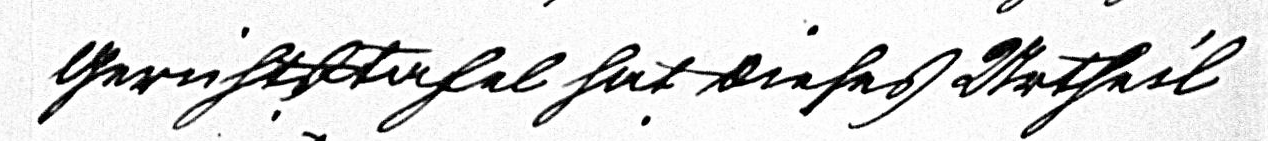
Gerichtstafel hat dieses Urtheil
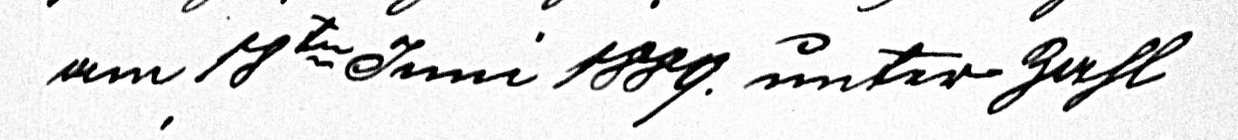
am 18ten Juni 1889. unter Zahl
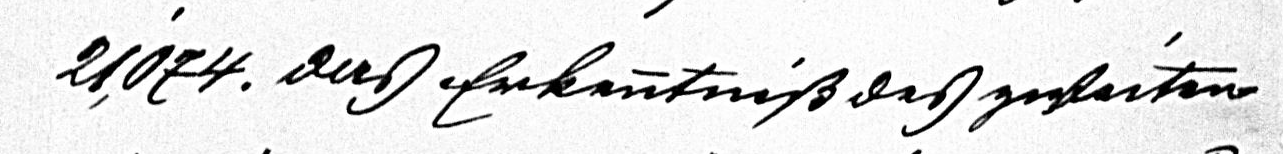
21,074. das Erkenntniß des zweiten
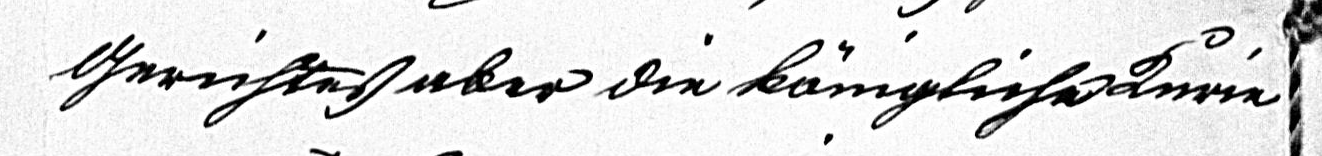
Gerichtes aber die königliche Kurie
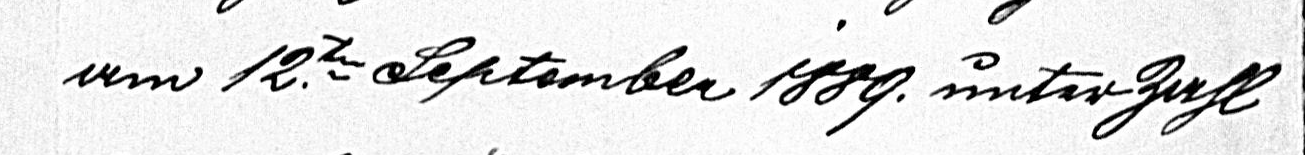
am 12.ten September 1889. unter Zahl
